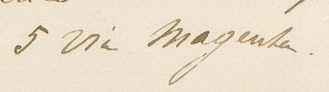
5 Via Magenta.
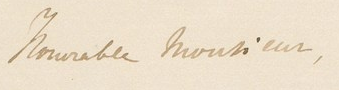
Honorable Monsieur,
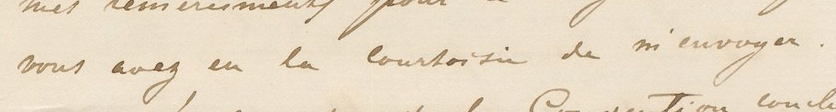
vous avez eu la courtoisie de m'envoyer.
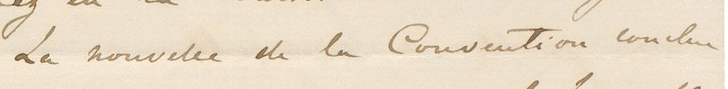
La nouvelle de la Convention conclue
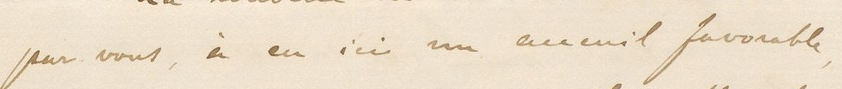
par vous, à eu ici un accueuil favorable,
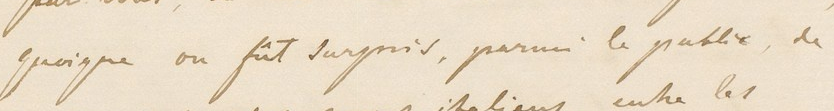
quoique on fût surpris, parmi le public, de
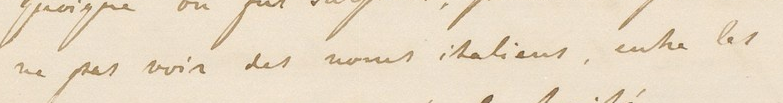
ne pas voir des noms italiens, entre les
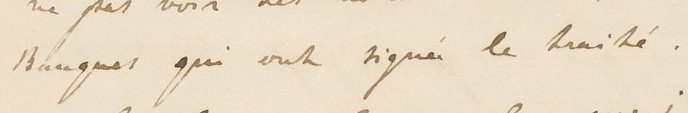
Banques qui ont signé le traité.
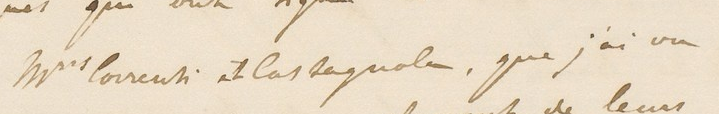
MresCorrenti et Castagnola, que j'ai vu
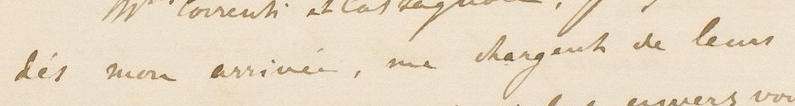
dés mon arrivée, me chargent de leurs
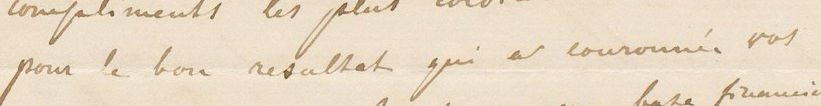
pour le bon resultat qui a couronnée vos
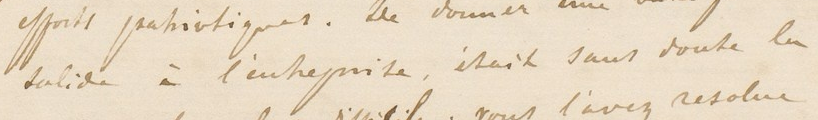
solide à l'entreprise, était sans doute la
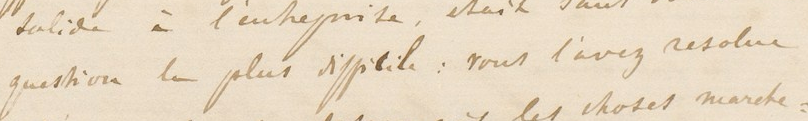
question la plus difficile: vous l'avez resolue
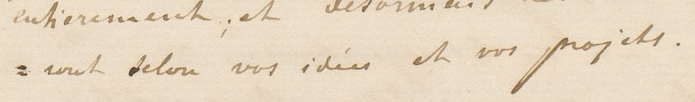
ront selon vos idées et vos projets.
